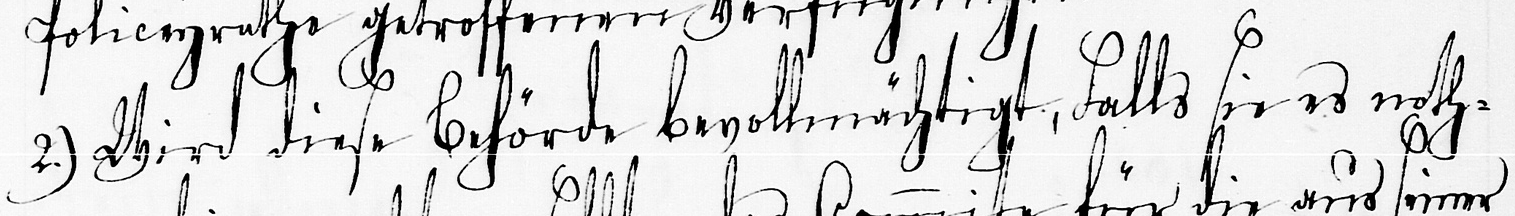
2.) Wird diese Behörde bevollmächtigt, falls sie es noth¬
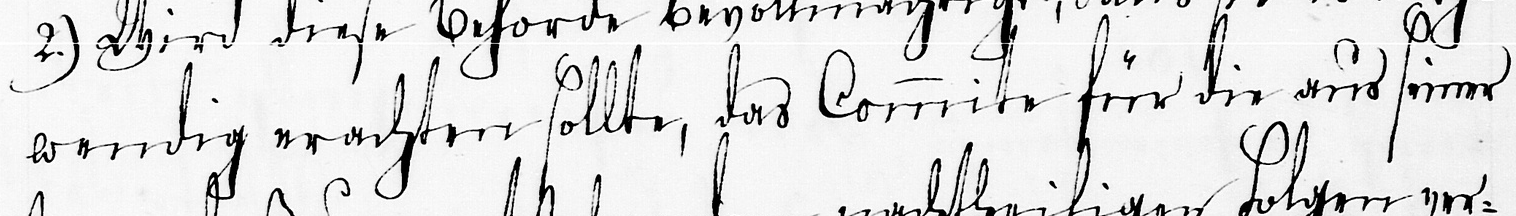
wendig erachten sollte, das Commite für die aus seiner
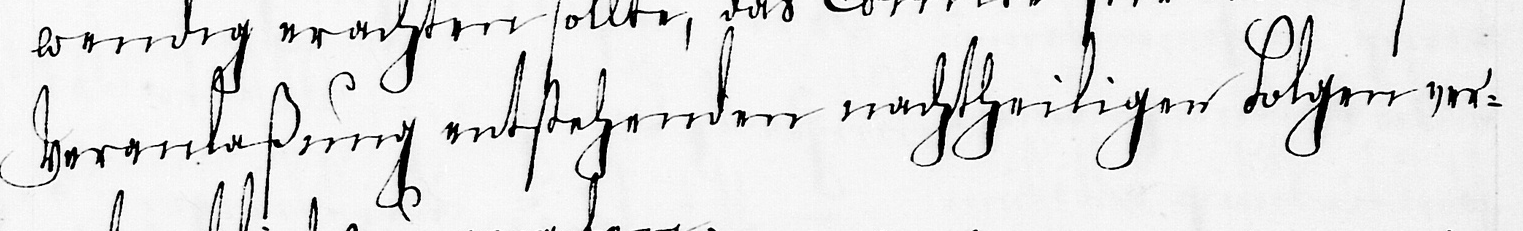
Veranlaßung entstehenden nachtheiligen Folgen ver¬
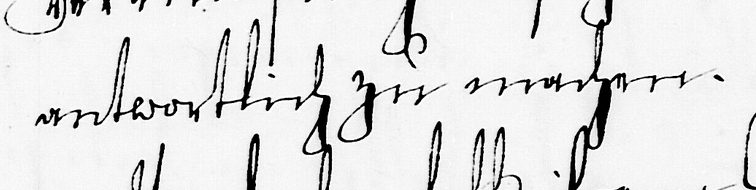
antwortlich zu machen.
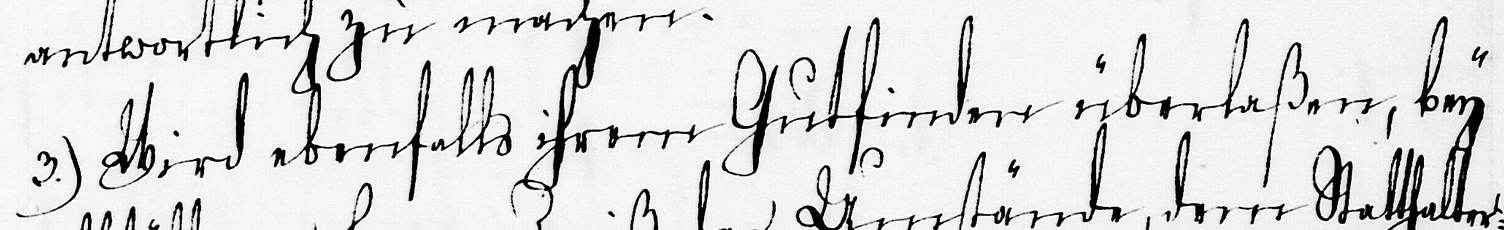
3.) Wird ebenfalls ihrem Gutfinden überlaßen, bey
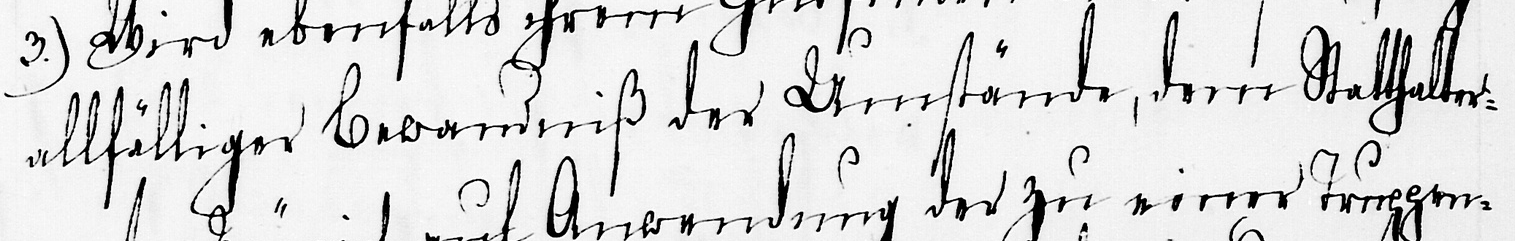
allfälliger Bewandniß der Umstände, dem Statthalt¬
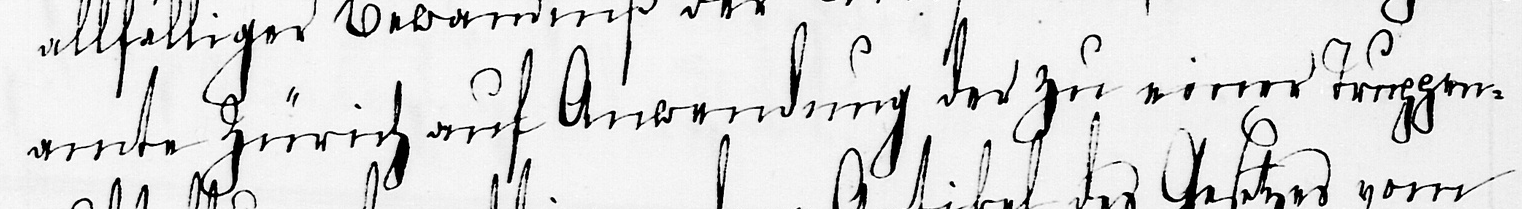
amte Zürich auf Anwendung der zu einer Truppen¬
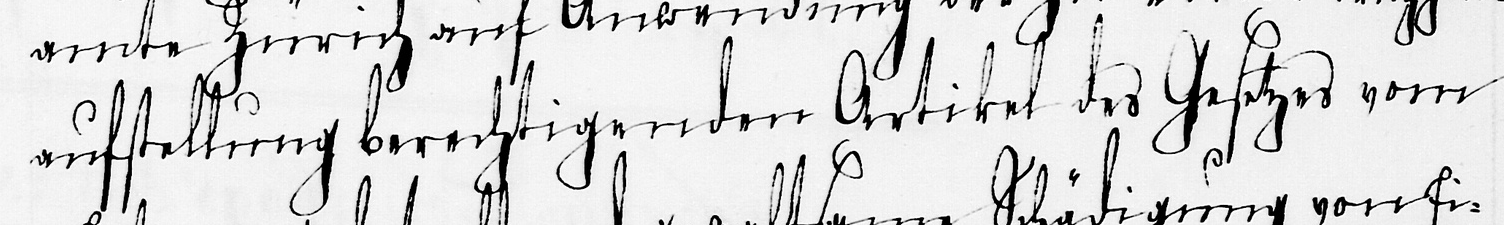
aufstellung berechtigenden Artikel des Gesetzes vom
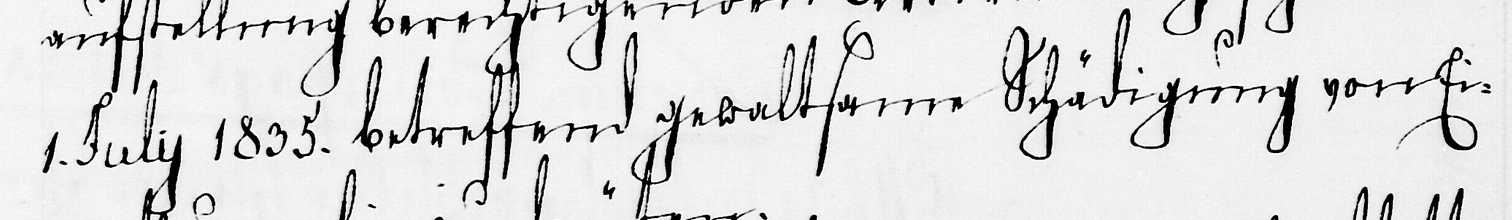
July 1835. betreffend gewaltsame Schädigung von Ei¬
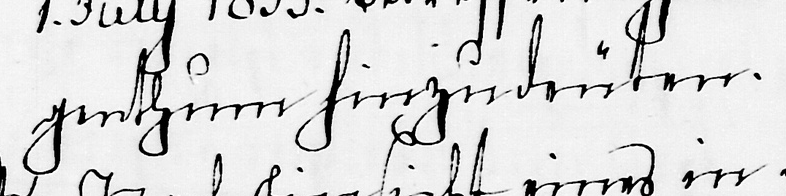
genthum hinzudeüten.
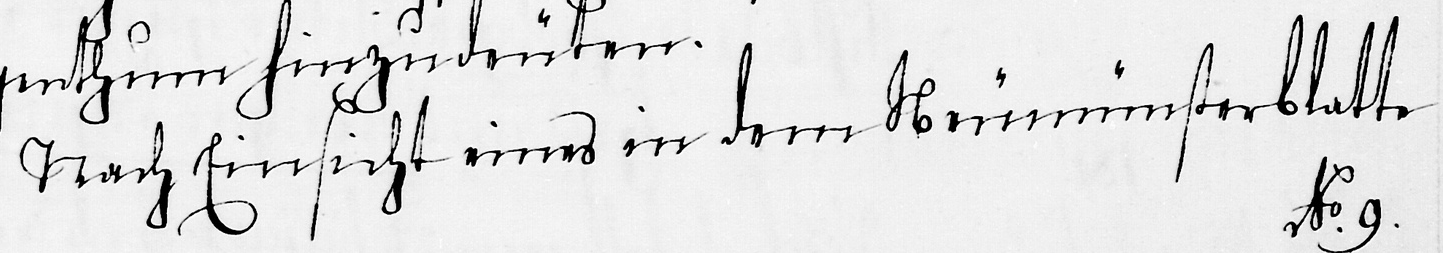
Nach Einsicht eines in dem Neumünsterblatte
